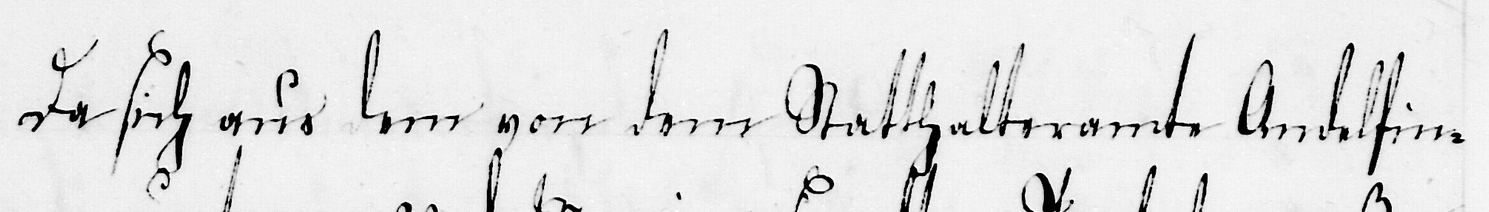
Da sich aus dem von dem Statthalteramte Andelfin¬
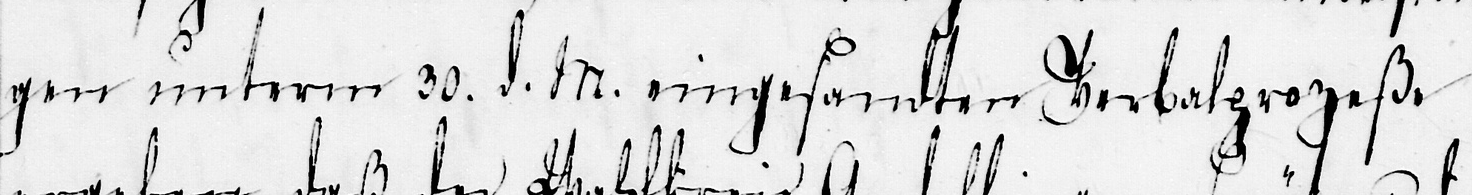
gen unterm 30. d. M. eingesandten Verbalprozeße
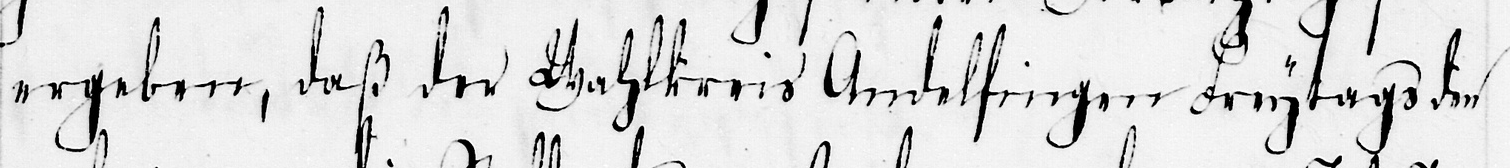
ergeben, daß der Wahlkreis Andelfingen Freytags den
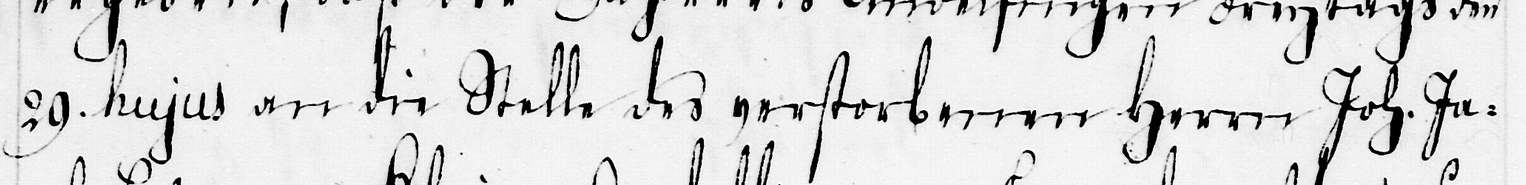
29. hujus an die Stelle des verstorbenen Herrn Joh. Ja¬
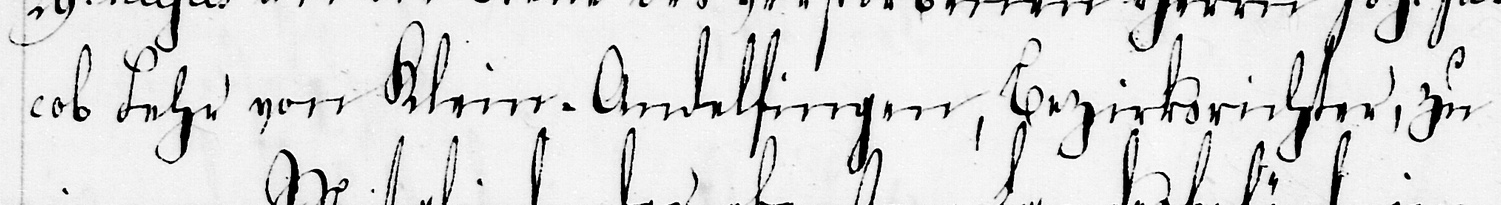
cob Fehr von Klein-Andelfingen, Bezirksrichter, zu
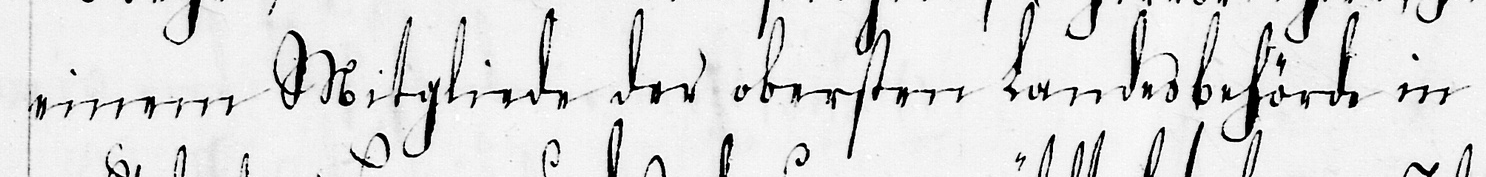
einem Mitgliede der obersten Landesbehörde in
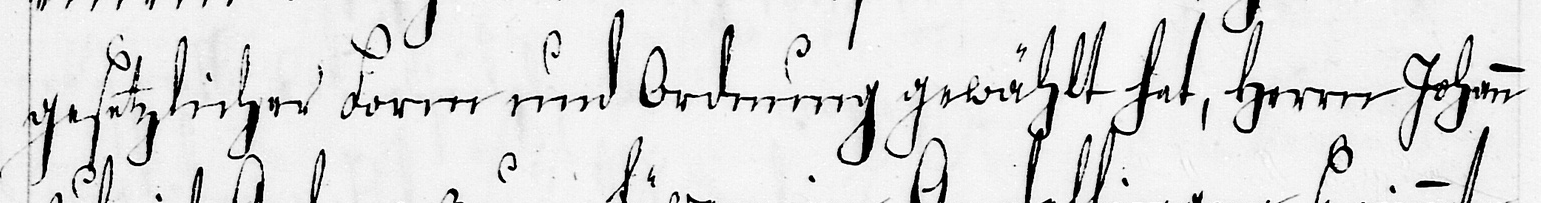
gesetzlicher Form und Ordnung gewählt hat, Herrn Johann
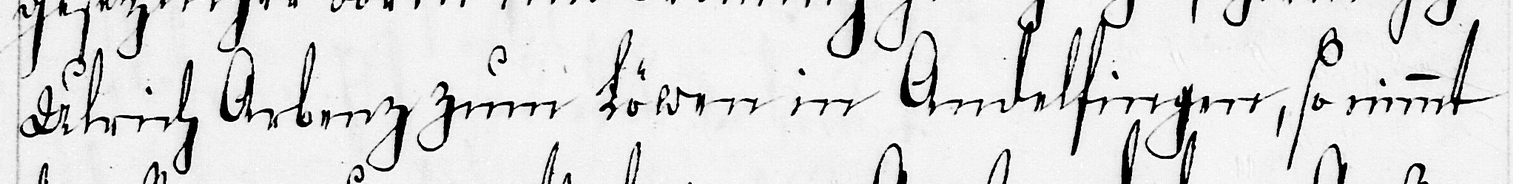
Ulrich Arbenz zum Löwen in Andelfingen, so nimmt
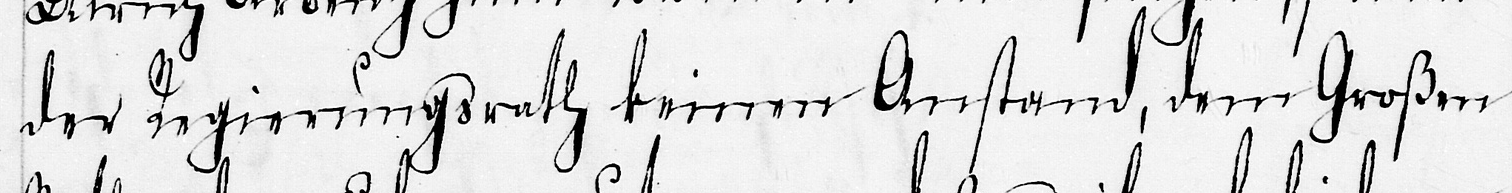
der Regierungsrath keinen Anstand, dem Großen
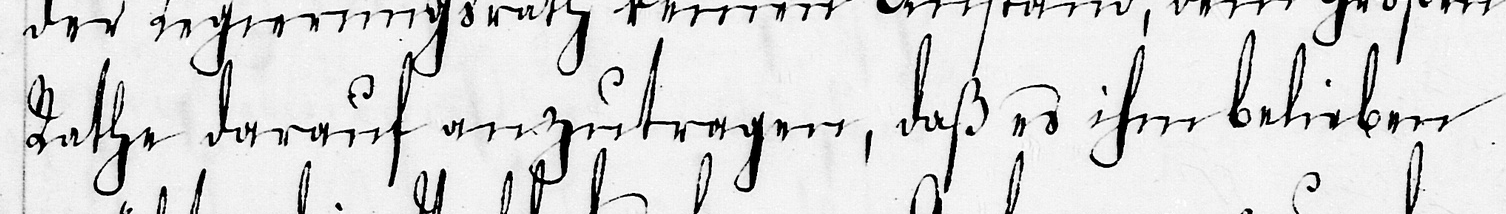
Rathe darauf anzutragen, daß es ihm belieben
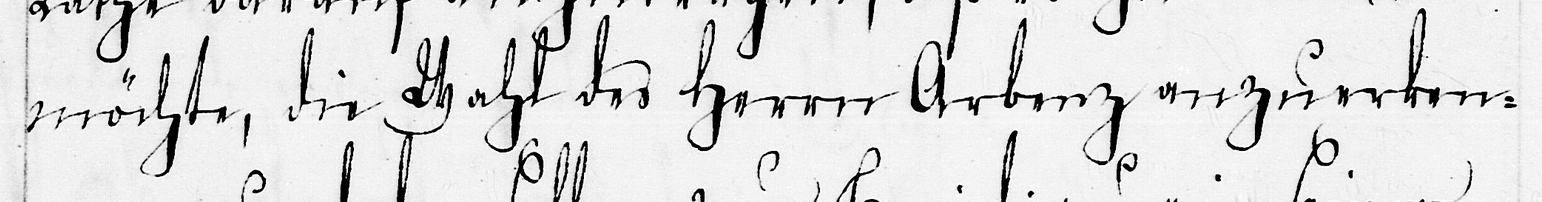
möchte, die Wahl des Herrn Arbenz anzuerken¬
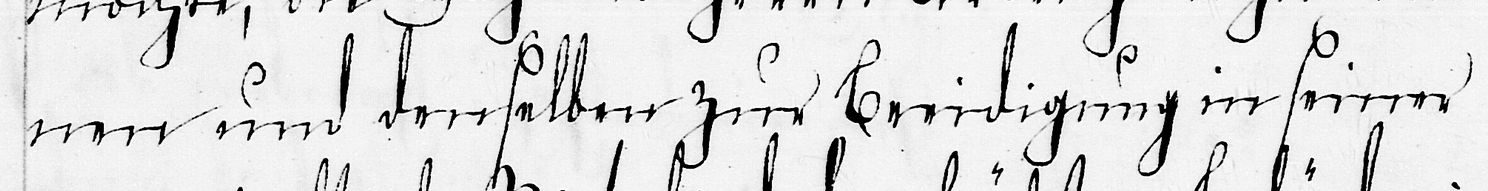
nen und denselben zur Beeidigung in seiner
